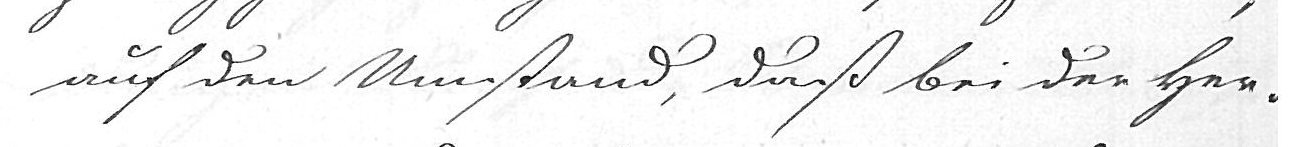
auf den Umstand, daß bei der Her-
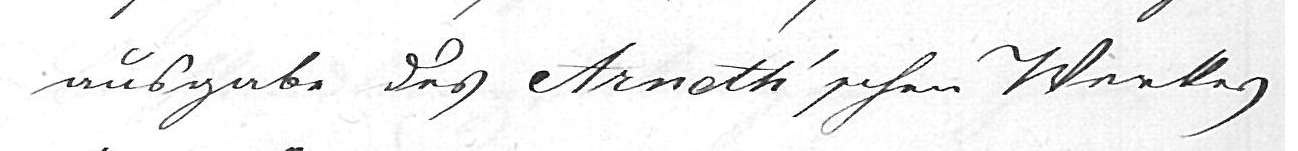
ausgabe des Arneth'schen Werkes
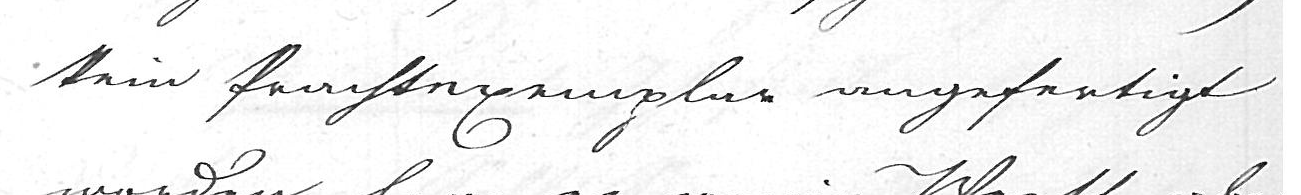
kein Prachtexemplar angefertigt
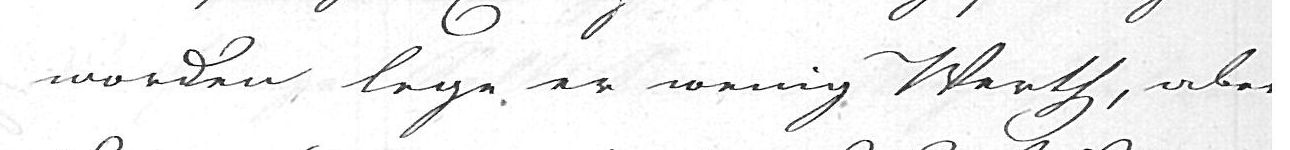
worden, lege er wenig Werth, aber
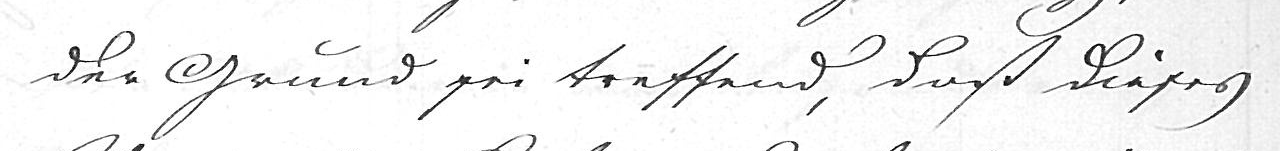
der Grund sein treffend, daß dieses
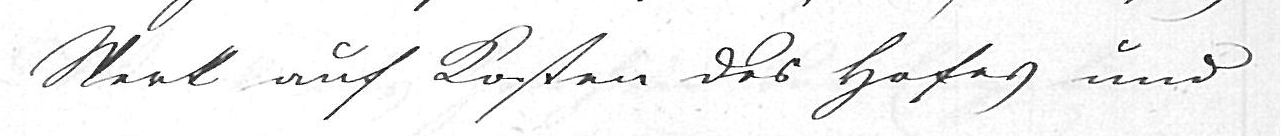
Werk auf Kosten des Hofes und
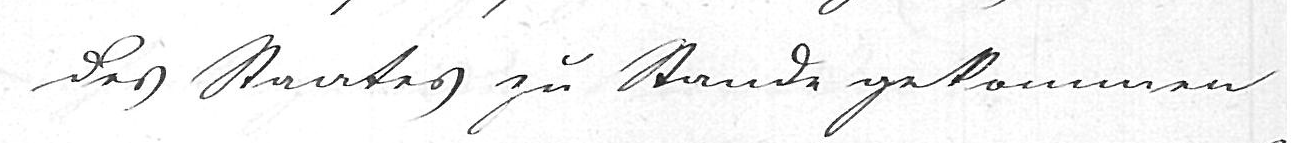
des Staates zu Stande gekommen
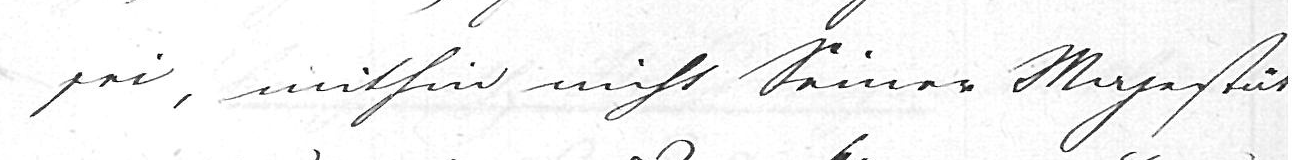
sei, mithin nicht Seiner Majestät
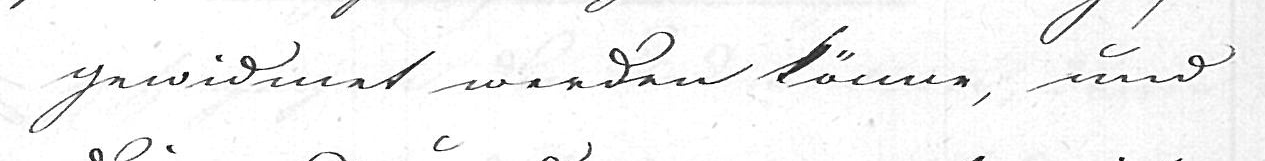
gewidmet werden könne, und
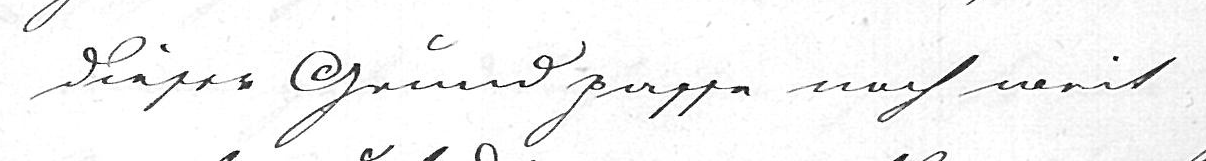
dieser Grund passe noch weit
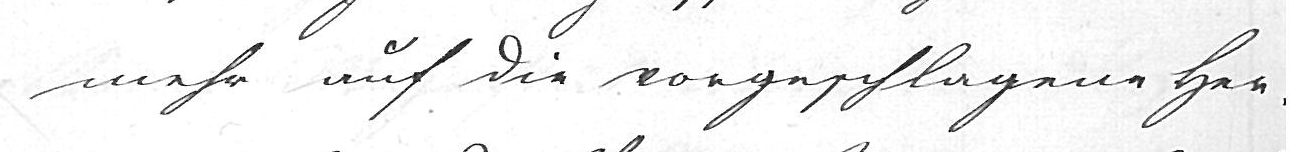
mehr auf die vorgeschlagene Her-
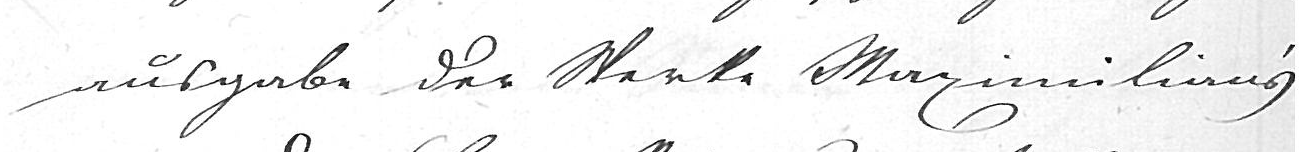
ausgabe der Werke Maximilians.
